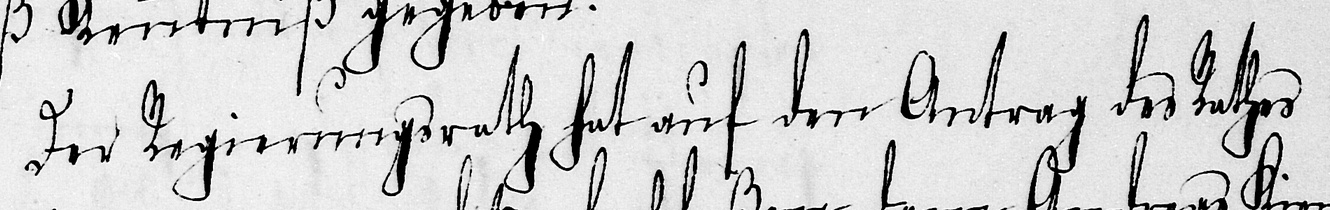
Der Regierungsrath hat auf den Antrag des Rathes
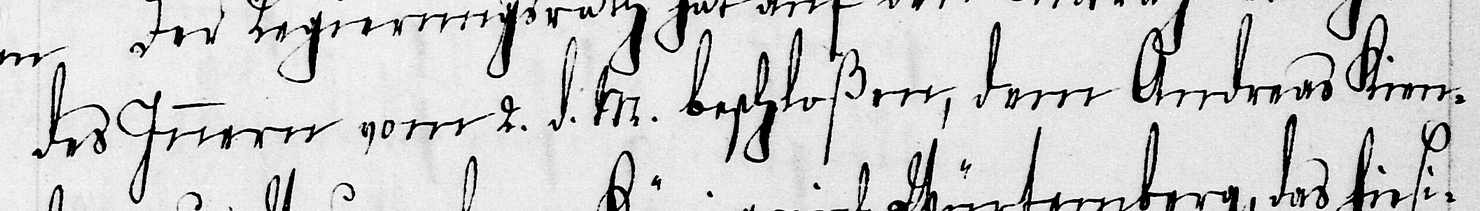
des Innern vom 2. d. M. beschloßen, dem Andreas Kien¬
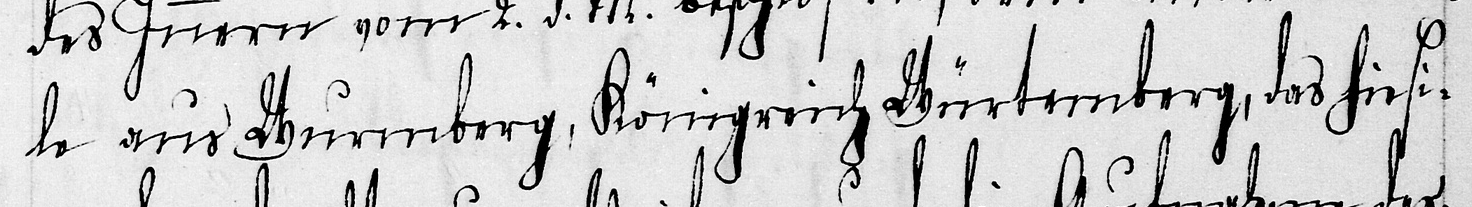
le aus Wurmberg, Königreich Würtemberg, das hiesi¬
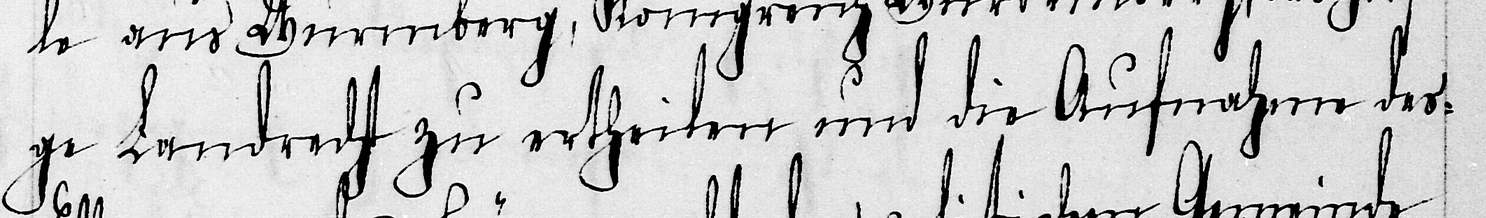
ge Landrecht zu ertheilen und die Aufnahme deß¬
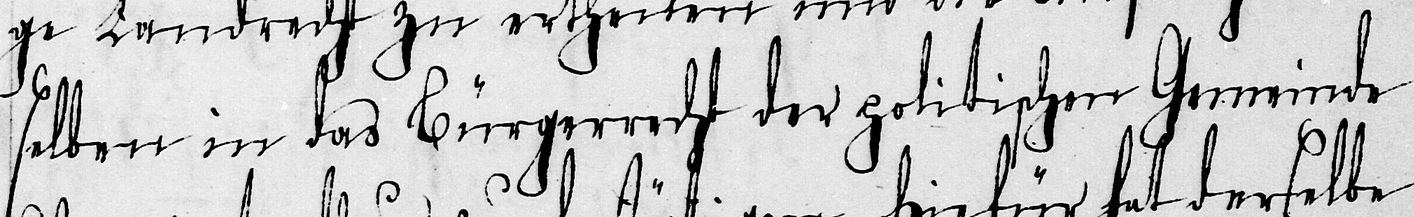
elben in das Bürgerrecht der politischen Gemeinde
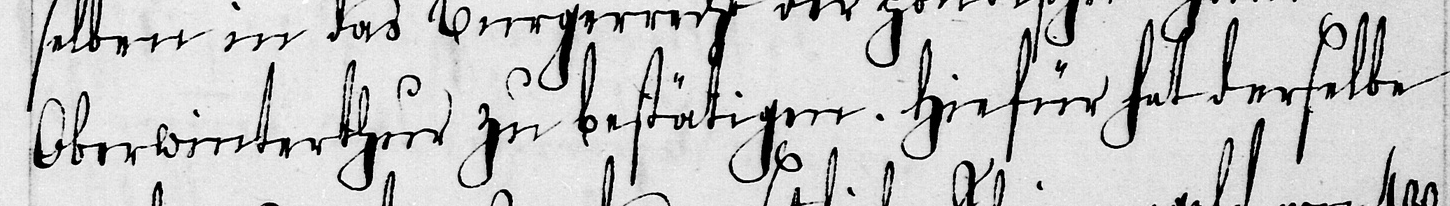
Oberwinterthur zu bestätigen. Hiefür hat derselbe
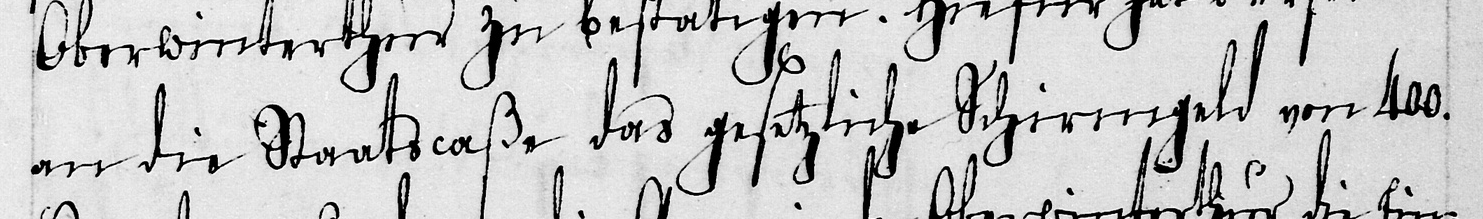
an die Staatscaße das gesetzliche Schirmgeld von 400.
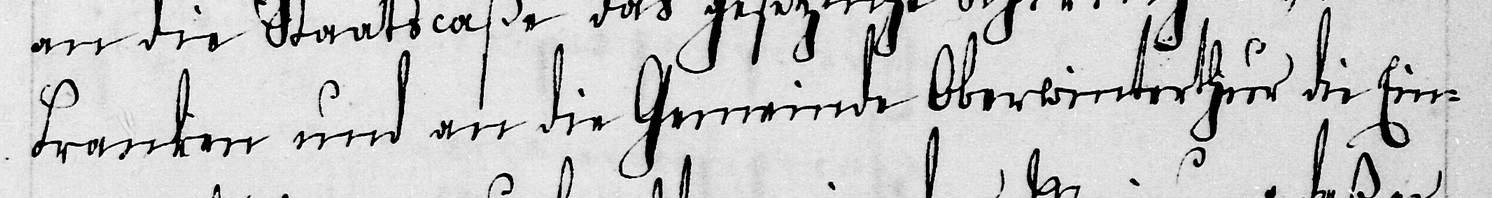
Franken und an die Gemeinde Oberwinterthur die Ein¬
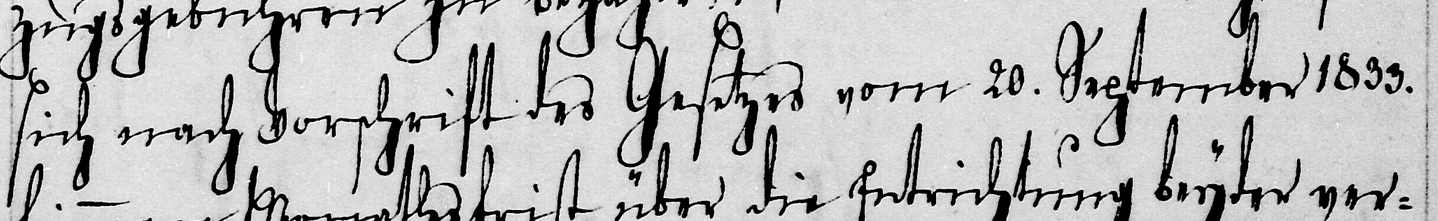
sich nach Vorschrift des Gesetzes vom 20. September 1833.
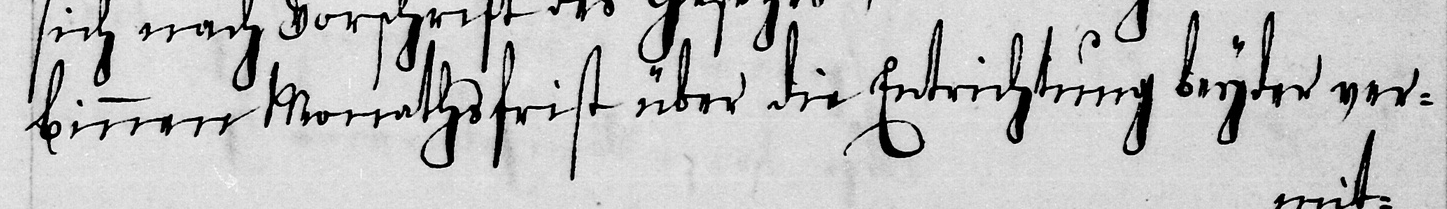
binnen Monathsfrist über die Entrichtung beyder ver-
